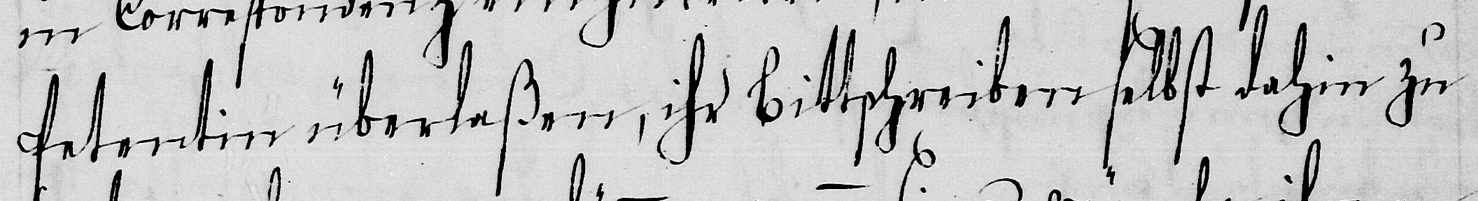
Petentin überlaßen, ihr Bittschreiben selbst dahin zu
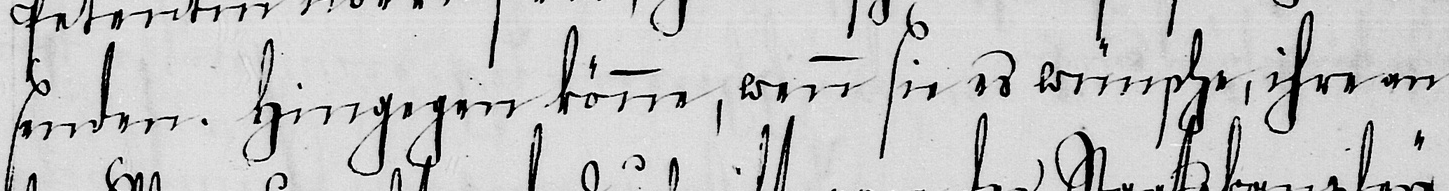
senden. Hingegen könne, wenn sie es wünsche, ihre an
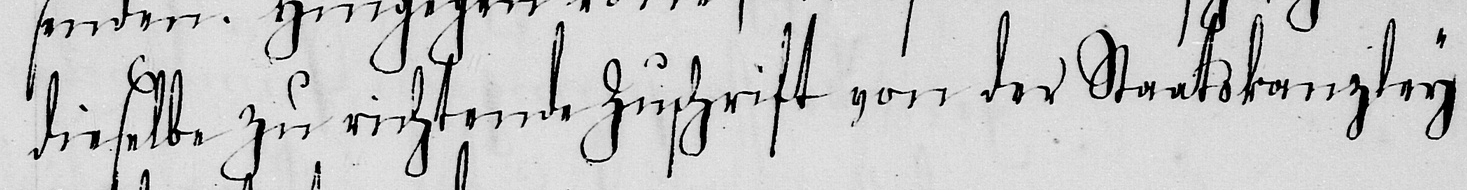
dieselbe zu richtende Zuschrift von der Staatskanzley
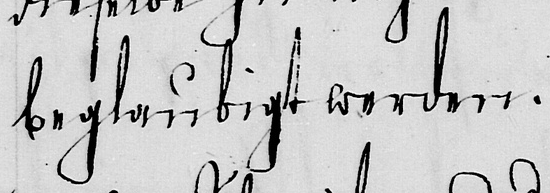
beglaubigt werden.
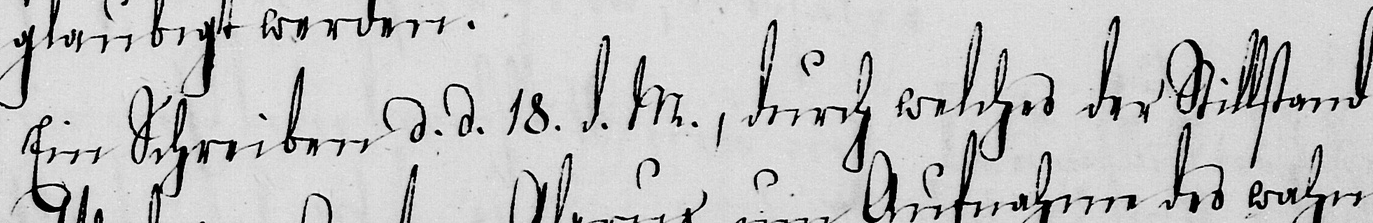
Ein Schreiben d. d. 18. d. M., durch welches der Stillstand
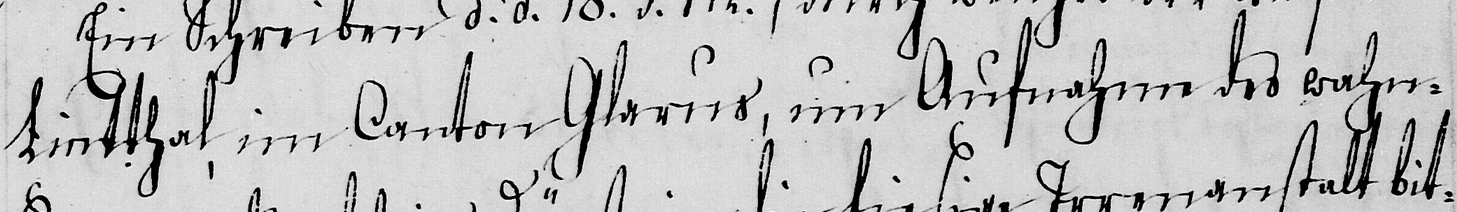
Lintthal, im Canton Glarus, um Aufnahme des wahn¬
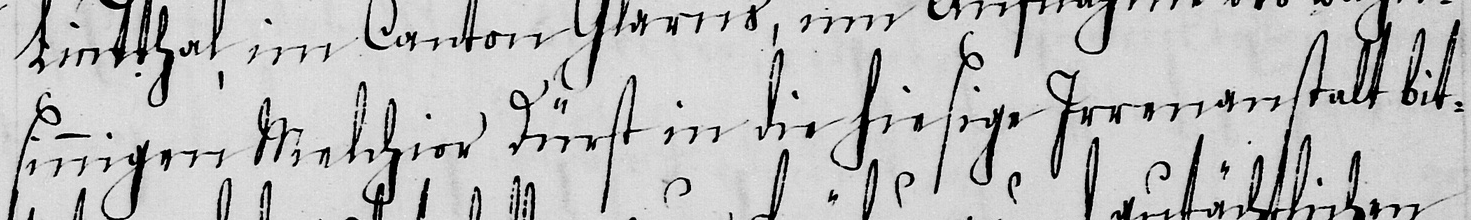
sinnigen Melchior Dürst in die hiesige Irrenanstalt bit¬
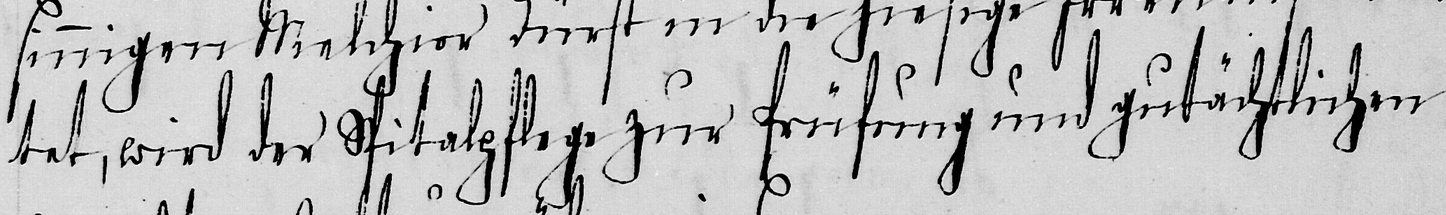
tet, wird der Spitalpflege zur Prüfung und gutächtlichen
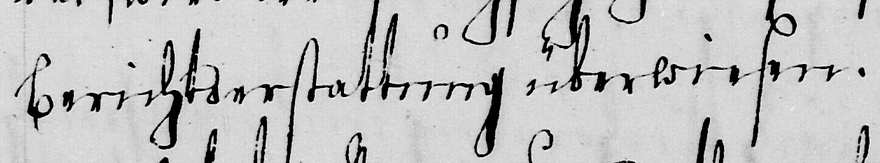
Berichtserstattung überwiesen.
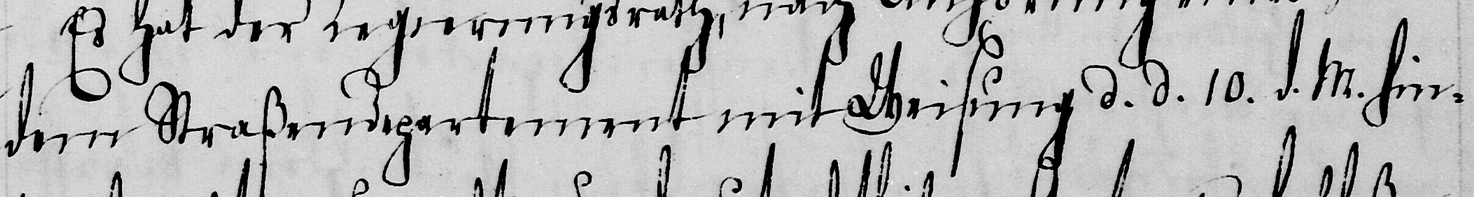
dem Straßendepartement mit Weisung d. d. 10. d. M. hinte¬
